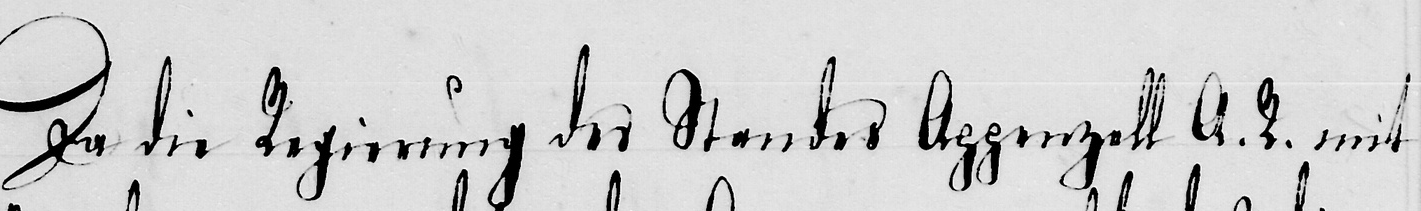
Da die Regierung des Standes Appenzell A. R. mit
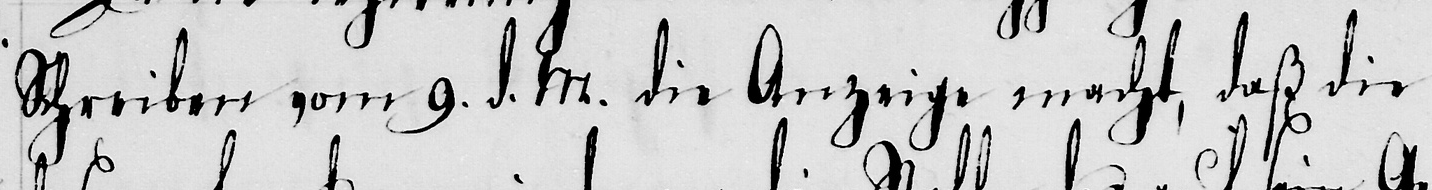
Schreiben vom 9. d. M. die Anzeige macht, daß die
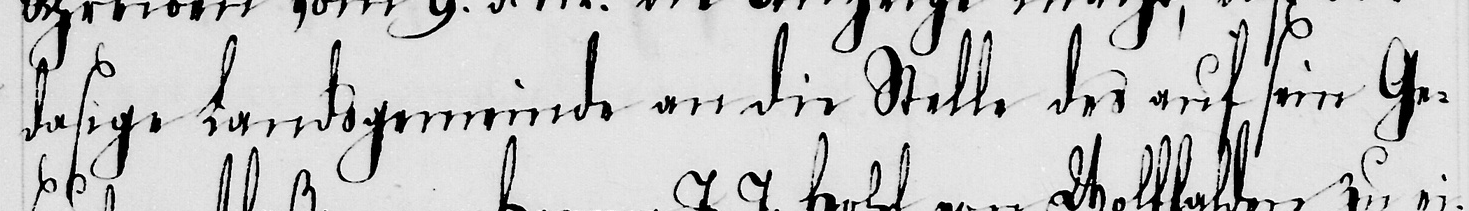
dasige Landsgemeinde an die Stelle des auf sein Ge¬
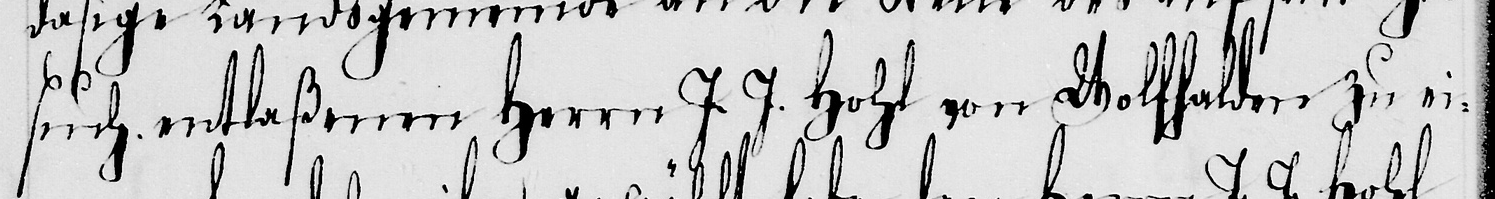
such entlaßenen Herrn J. J. Hohl von Wolfhalden zu ei¬
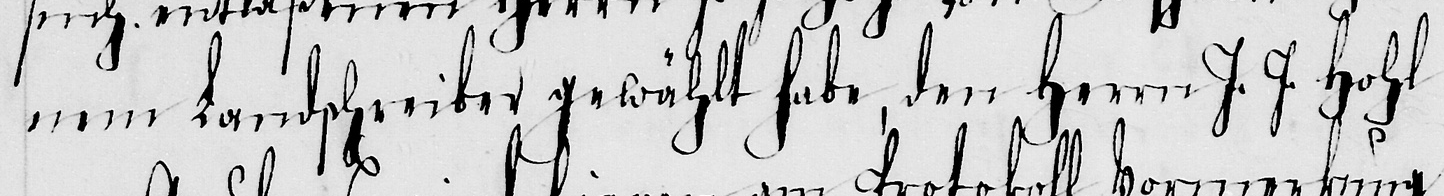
nem Landschreiber gewählt habe, den Herrn J. J. Hohl
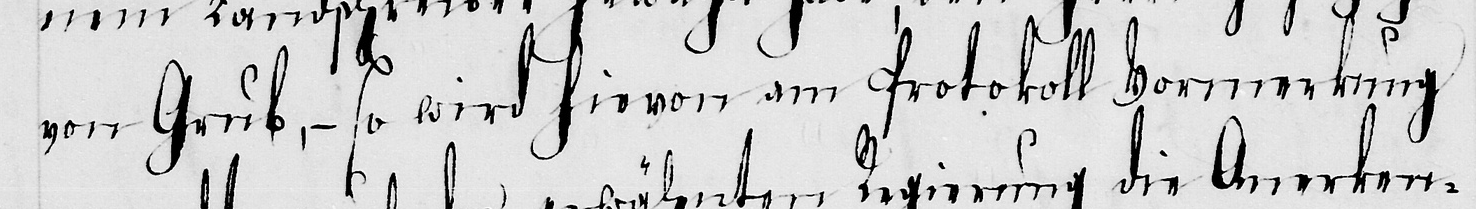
von Grub, – so wird hievon am Protokoll Vormerkung
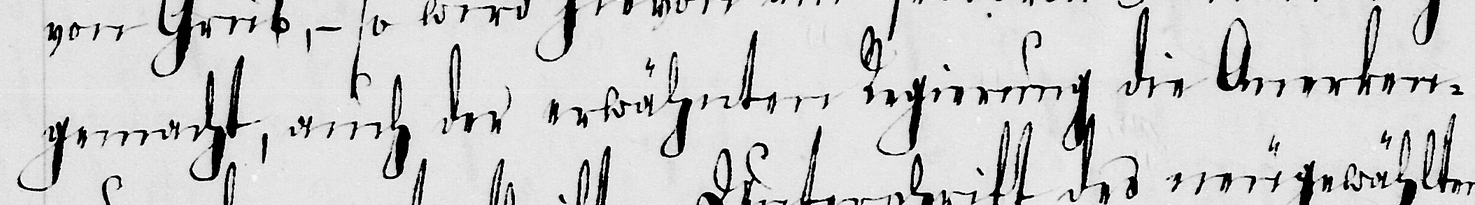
gemacht, auch der erwähnten Regierung die Anerken¬
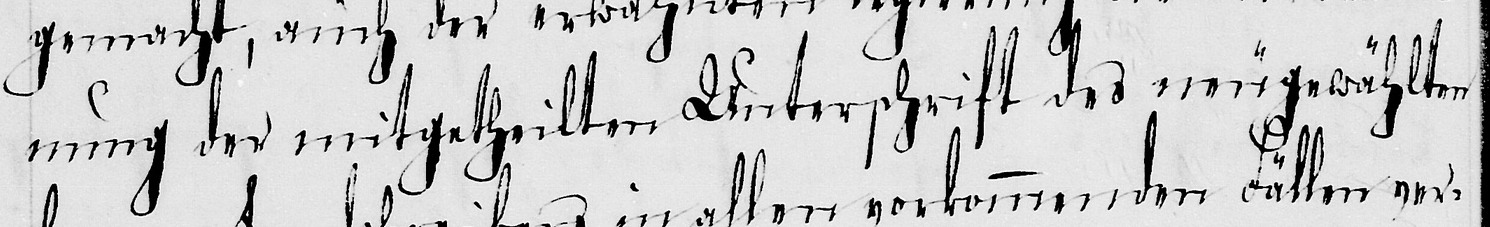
nung der mitgetheilten Unterschrift des neugewählten
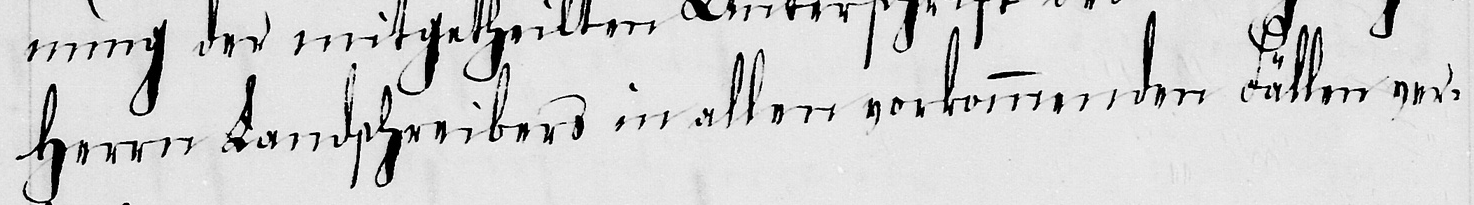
Herrn Landschreibers in allen vorkommenden Fällen ver¬
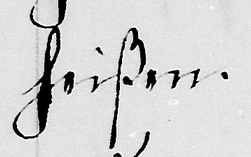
heißen.
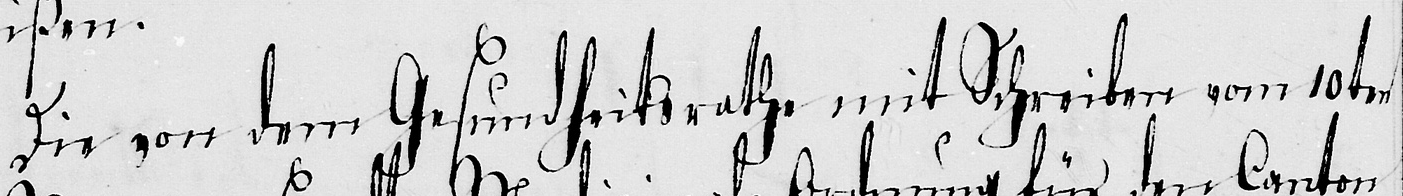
Die von dem Gesundheitsrathe mit Schreiben vom 10t¬
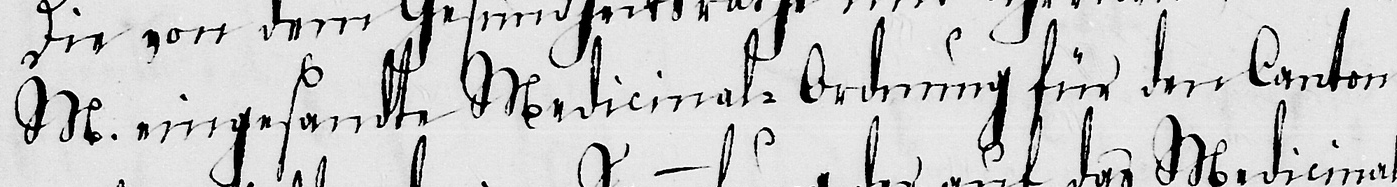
M. eingesandte Medicinal-Ordnung für den Canton
